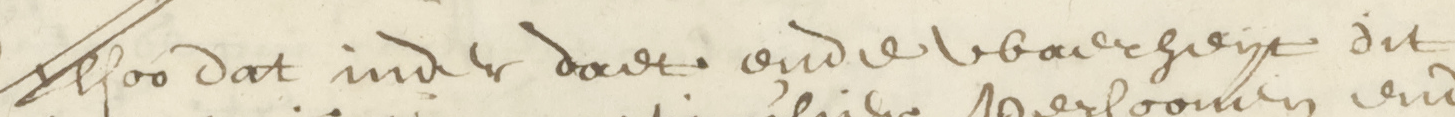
Alsoo dat inder daet ende waerheijt dit
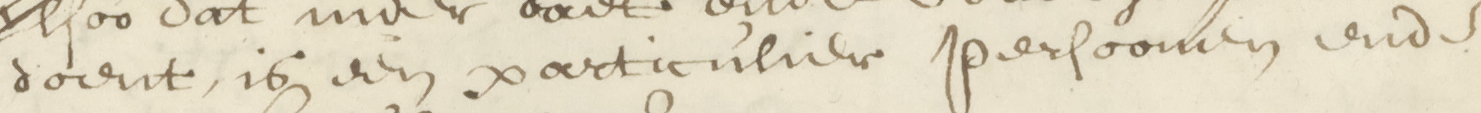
doent, is een particulier Persoonen ende
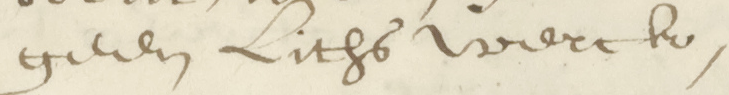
geen Liths werck.
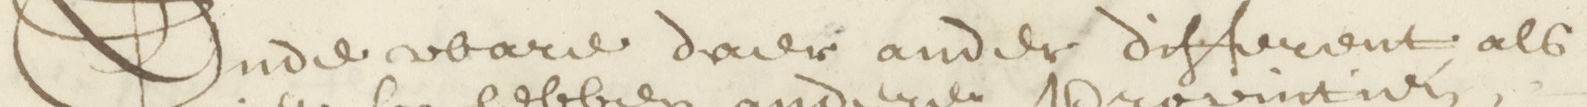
Ende ware daer ander different als
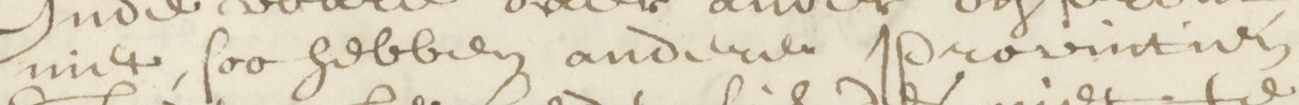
niet, soo hebben andere Provintien,
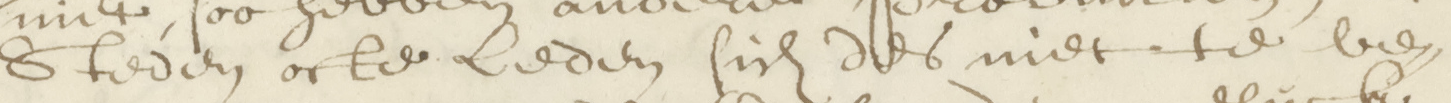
Steden ofte Leden sich des niet te be„
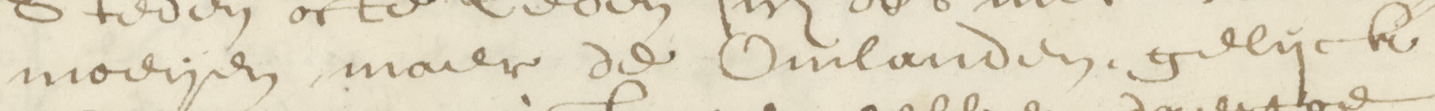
moeijen, maer de Omlanden, gelijck
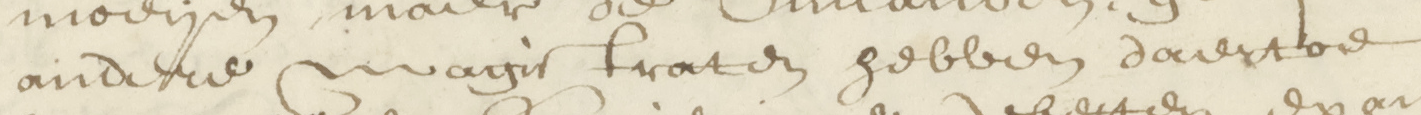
andere magistraten hebben daertoe
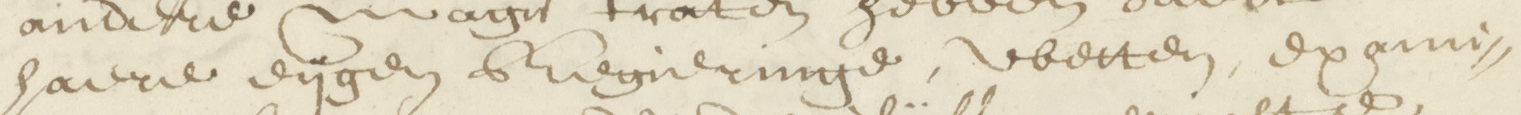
haere eijgen Regieringe, wetten, exami„
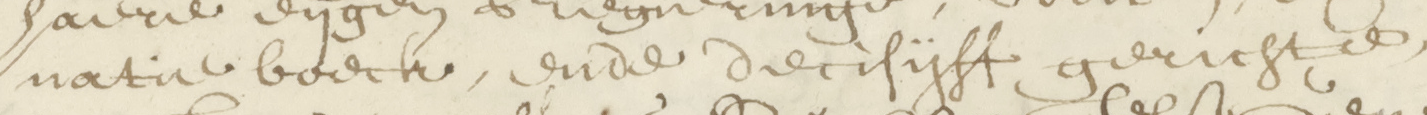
natie boeck, ende decisijff gerichte
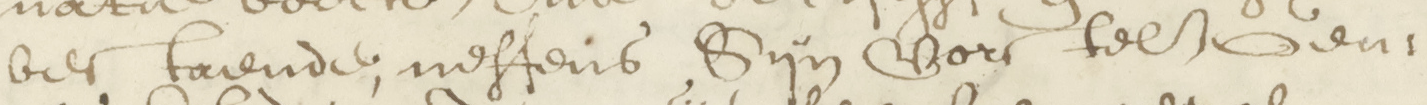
bestaende, neffens Sijn Vorstel Gen:
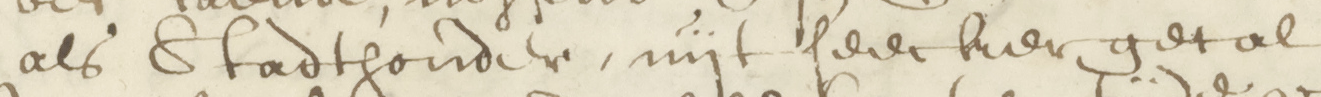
als Stadthouder, uijt seecker getal
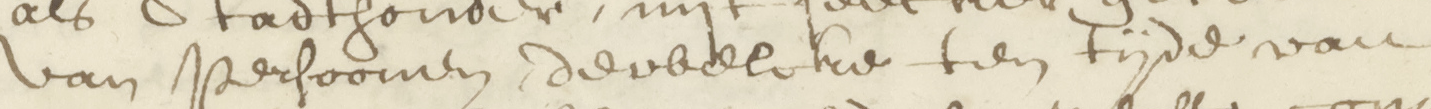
van Persoonen, dewelcke ten tijde van
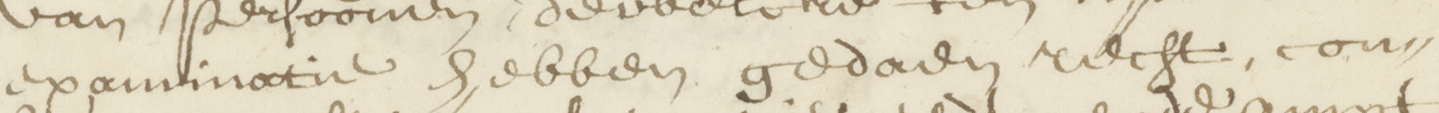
examinatie hebben gedaen recht, con„
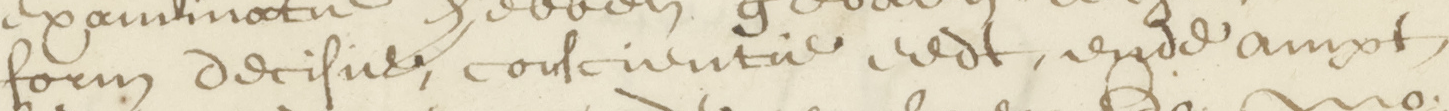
form decisie, conscientie eedt, ende ampt,
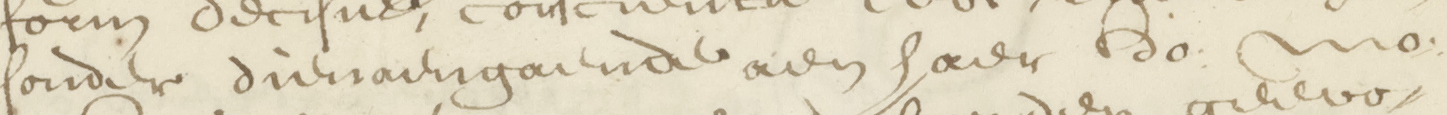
sonder dienaengaende aen haer Ho:Mo:
